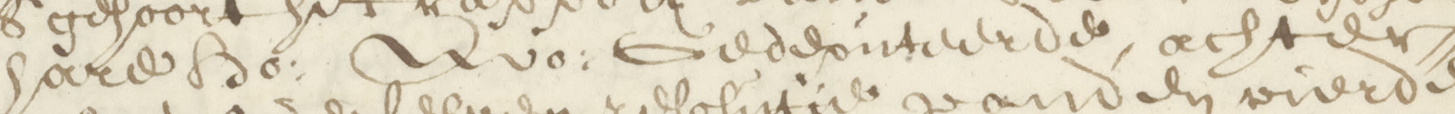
hare Ho:Mo: Gedeputeerde, achter„
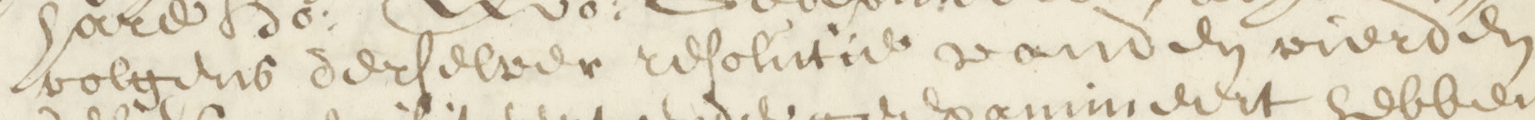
volgens derselver resolutie vanden vierden
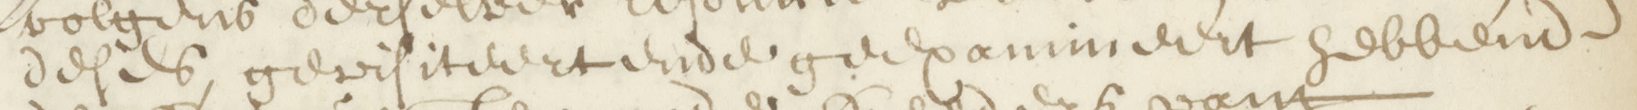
deses, gevisiteert ende geexamineert hebbende
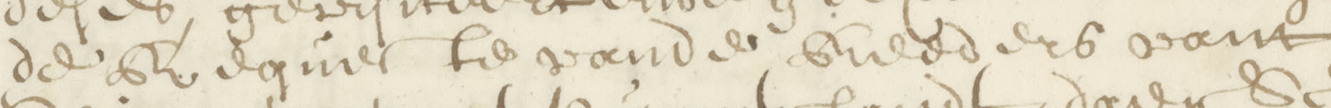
de Requeste vande Reeders vant
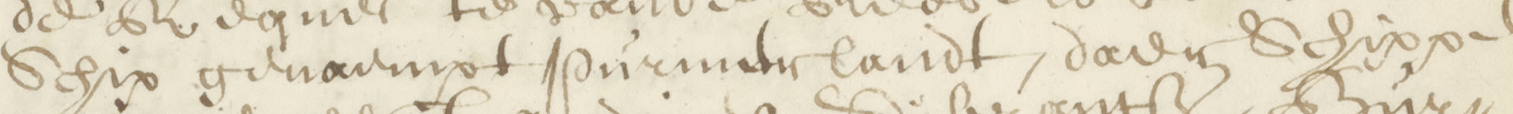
Schip genaempt Purmerlandt, daer Schipper
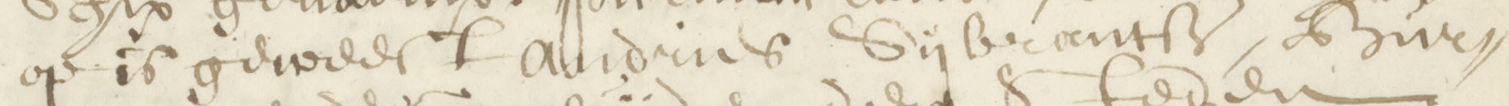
op is geweest Andries Sijbrandts, Bur„
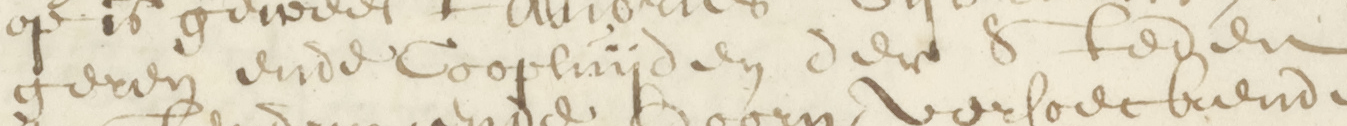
geren ende Coopluijden der Steden
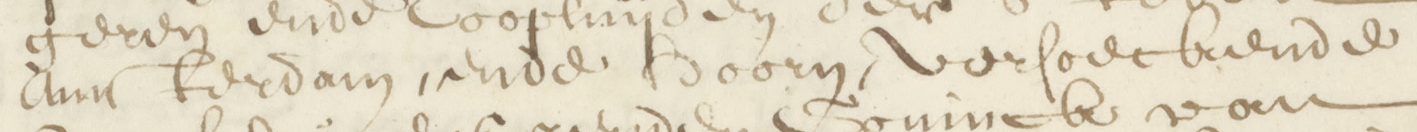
Amsterdam, ende Hoorn, versoeckende
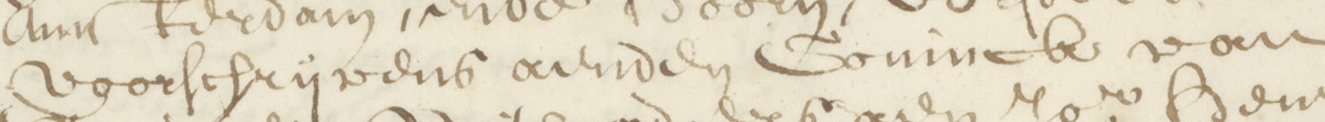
voorschrijvens aenden Coninck van
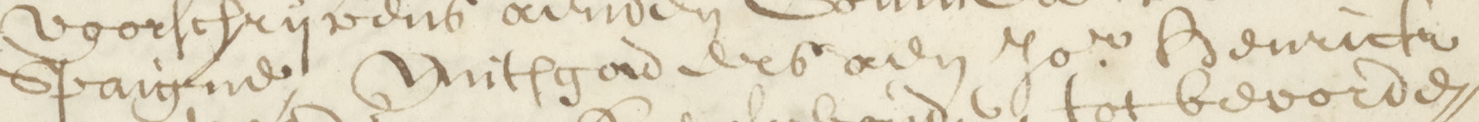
Spaigne, Mitsgaders aen Jor. Henrick
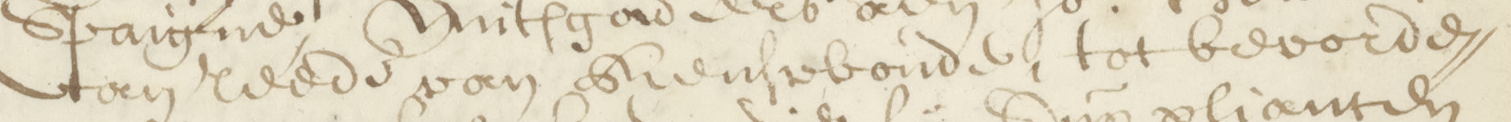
van Reede van Renswoude, tot bevorde„
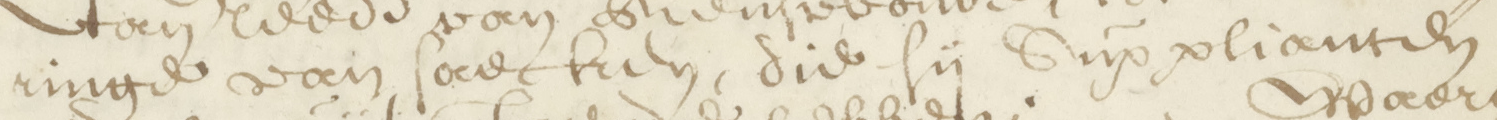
ringe van saecken, die sij Supplianten
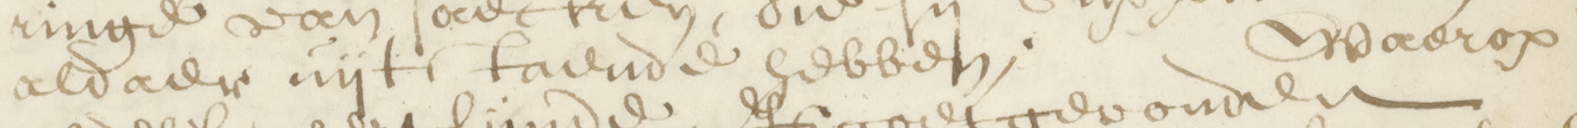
aldaer uijtstaende hebben; Waerop
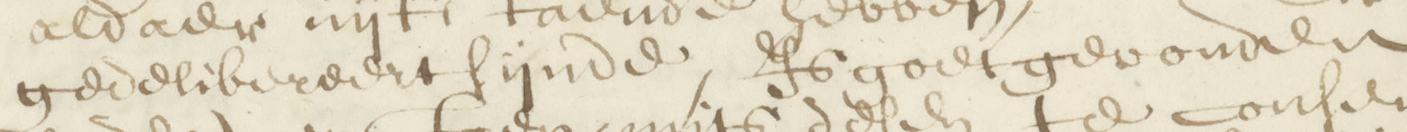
gedelibereert sijnde, Is goetgevonden
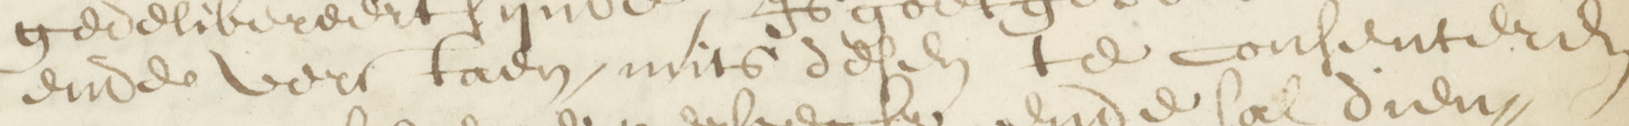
ende verstaen, mits desen te consenteren
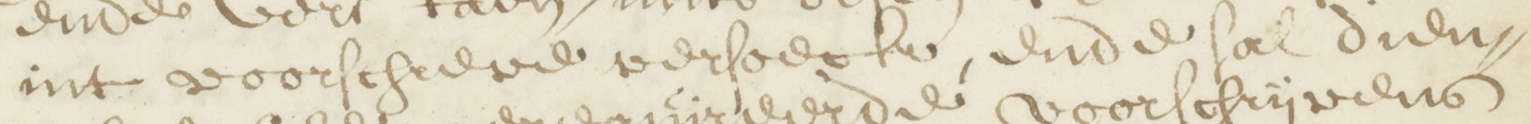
int voorschreve versoeck, ende sal dien„
